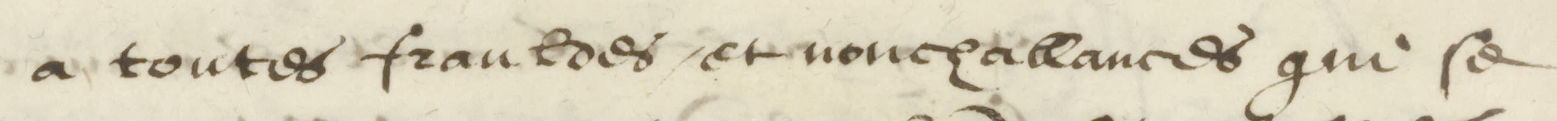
a toutes frauldes, et nonchallances qui se
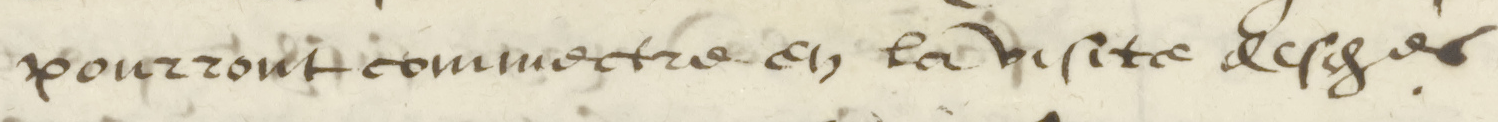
pourront commectre en la visite desdes
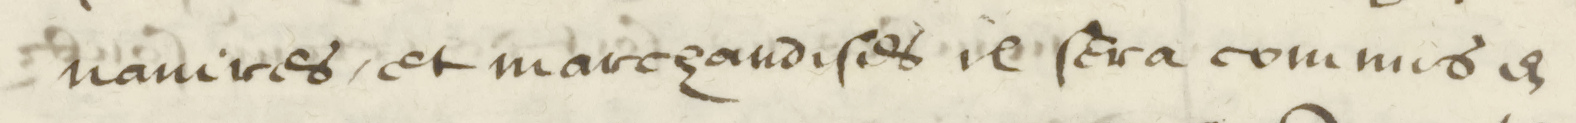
nauires, et marchandises il sera commis en
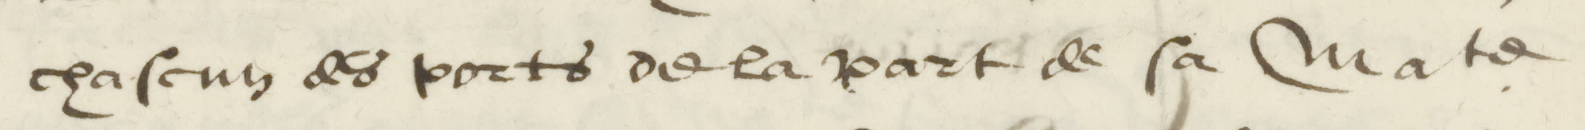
chascun des ports de la part de sa Mate
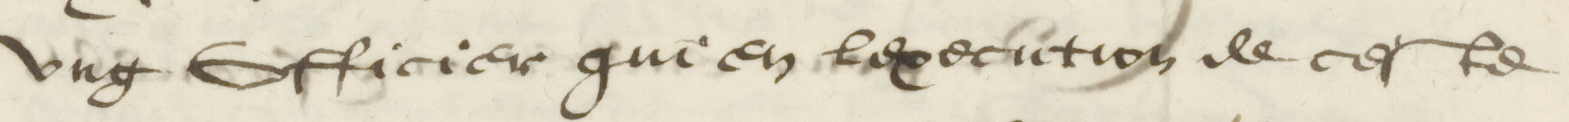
vng Officier qui en lexecution de ceste
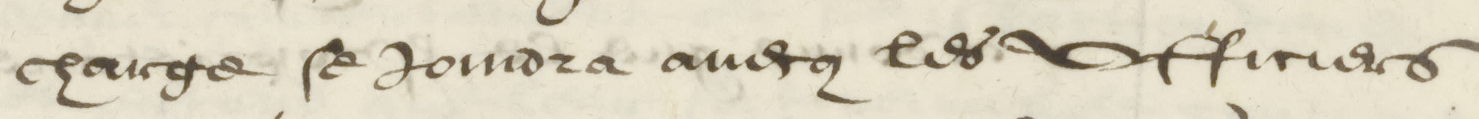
charge se joindra auecq les Officiers
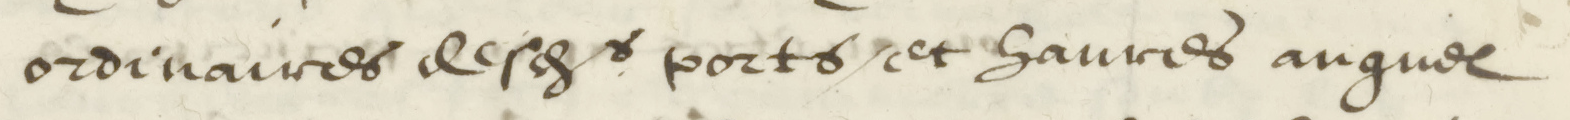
ordinaires desds ports et haures auquel
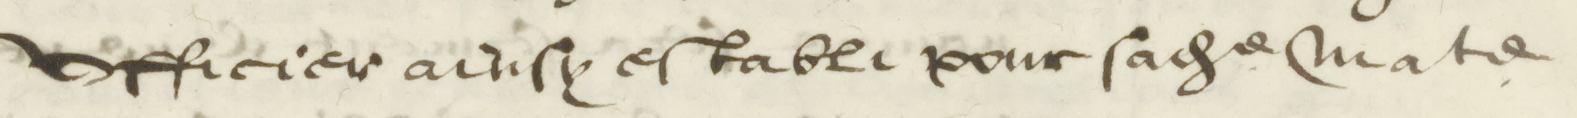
Officier ainsy establi pour sade Mate
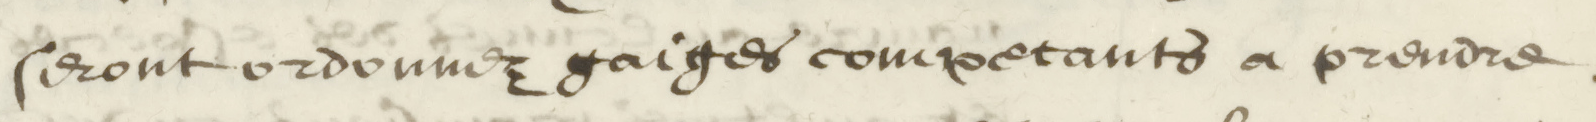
seront ordonnez gaiges competants a prendre
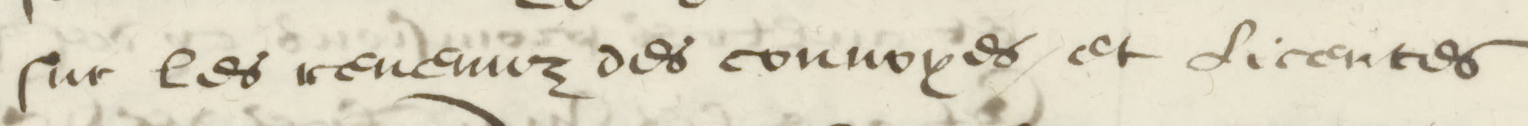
sur les reuenuz des conuoyes et licentes
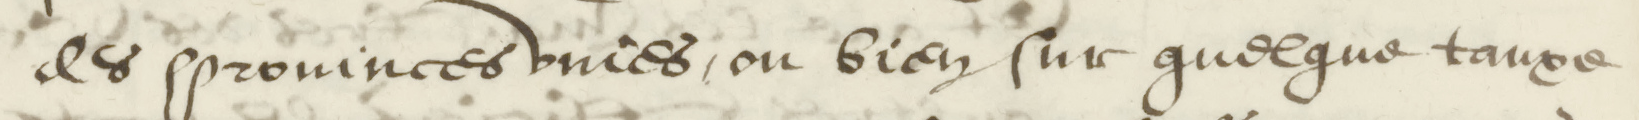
des prouinces vnies, ou bien, sur quelque tauxe
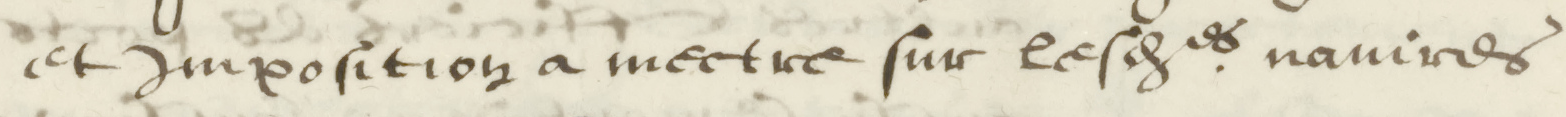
et Imposition a mectre sur lesdes nauires
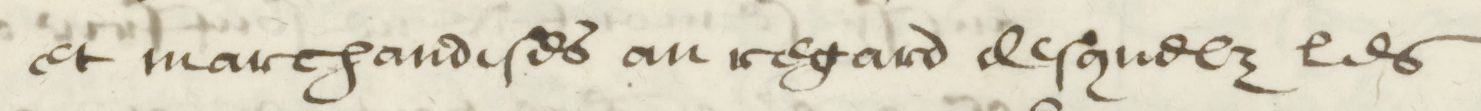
et marchandises au regard desquelz les
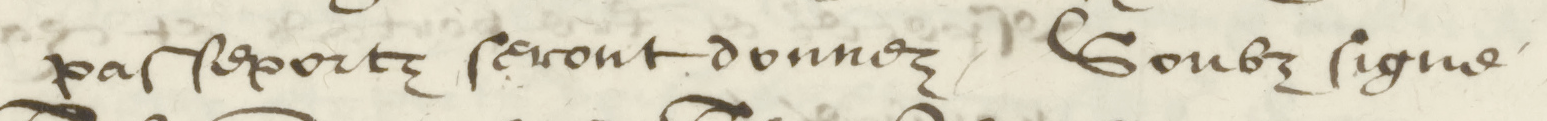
passeportz seront donnez, Soubz signe
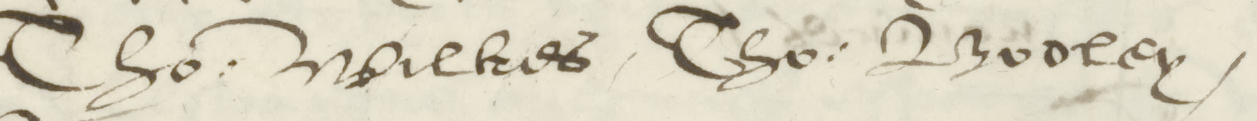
Tho: Wilkes, Tho: Bodley
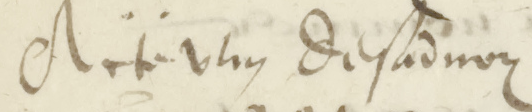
Acte van desaduey
